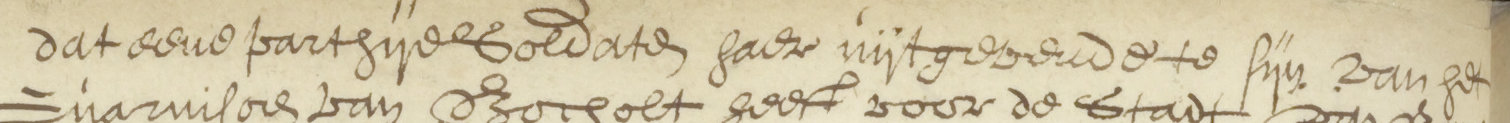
dat eene parthije Soldaten haer uijtgevende te sijn van het
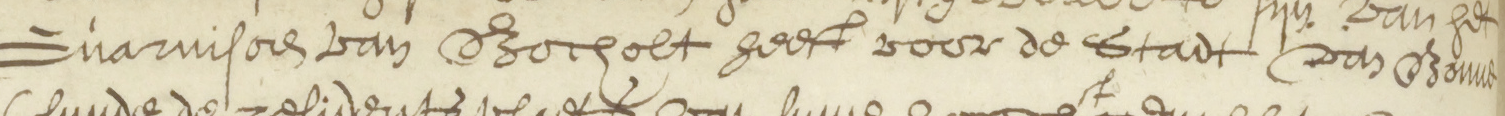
Guarnisoen van Bocholt heeft voor de Stadt van Bonne
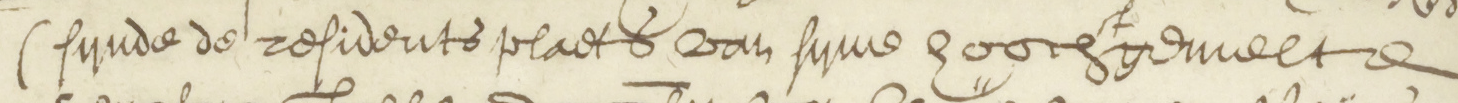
(sijnde de residents plaets van sijne hoochstgemelte
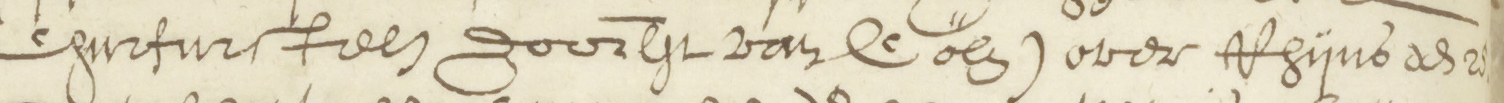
Churfurstel Doorlht. van Cöln) over Rhijns den 25
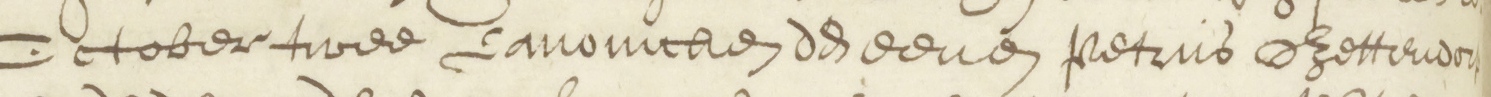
October twee Canonicken den eenen petrus Betterdorp
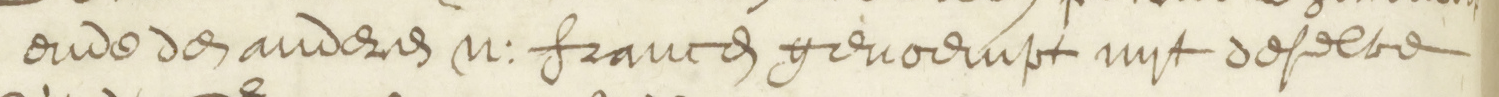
ende den andere n: francen genoempt uyt deselve
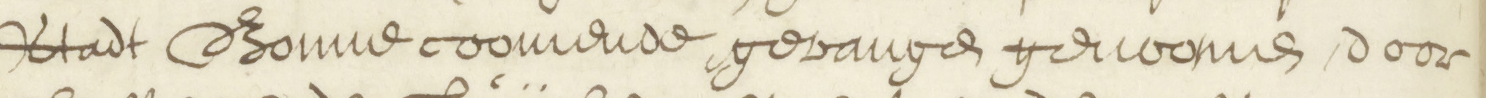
Stadt Bonne coomende, gevangen genoomen, door
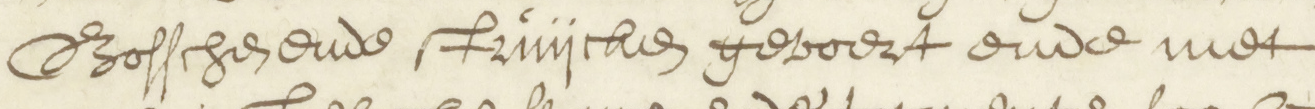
Bosschen ende struijcken gevoert ende met
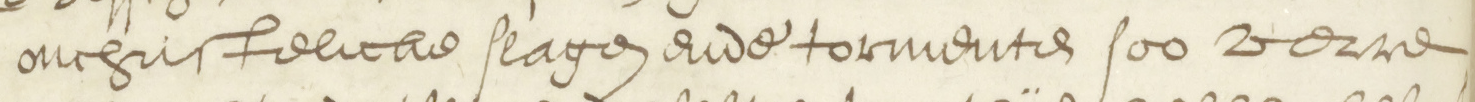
onchristelicke slagen ende tormenten soo verre
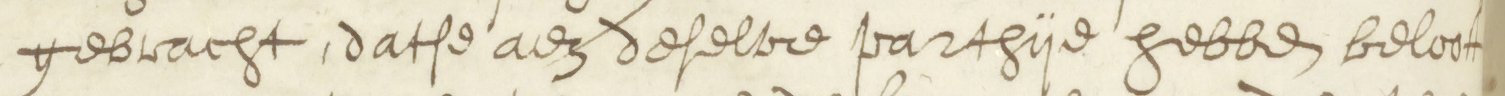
gebracht, datse aen deselve parthije hebben belooft
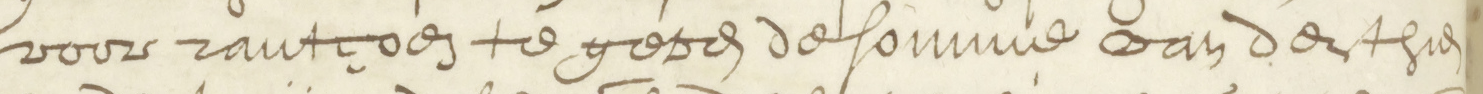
voor rantcoen te geven de somme van derthien
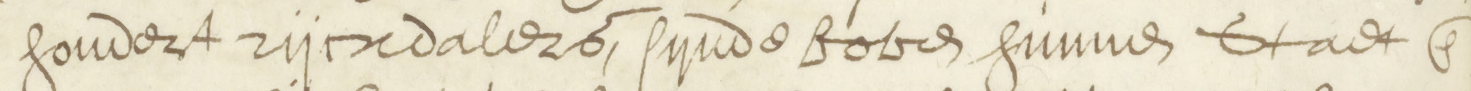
hondert rijcxdalers, sijnde boven hunnen Staet &
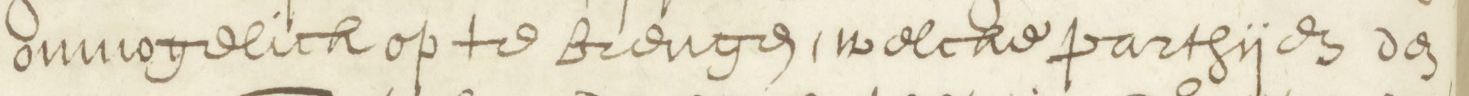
onmogelick op te brengen, welcke parthijen den
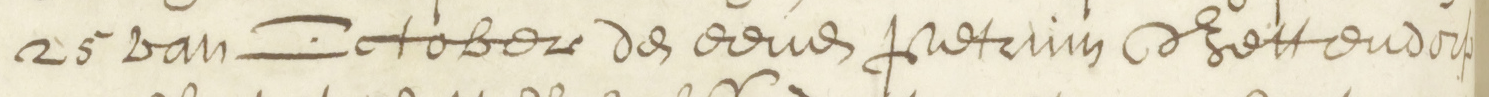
25 van October den eenen Petrum Bettendorp
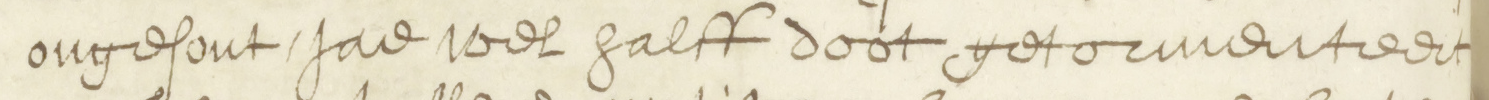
ongesont, jae wel halff doot getormenteert
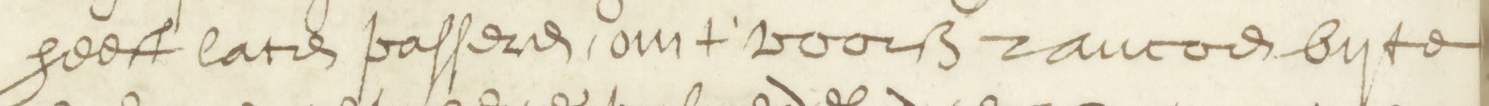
heeft laten passeren, om t‛voorss rancoen bij te
